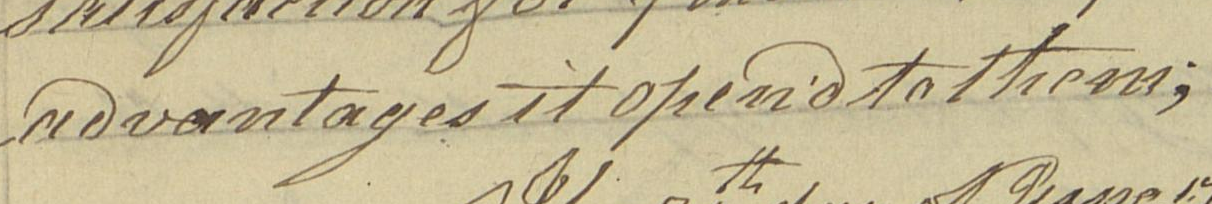advantages it open'd to them;
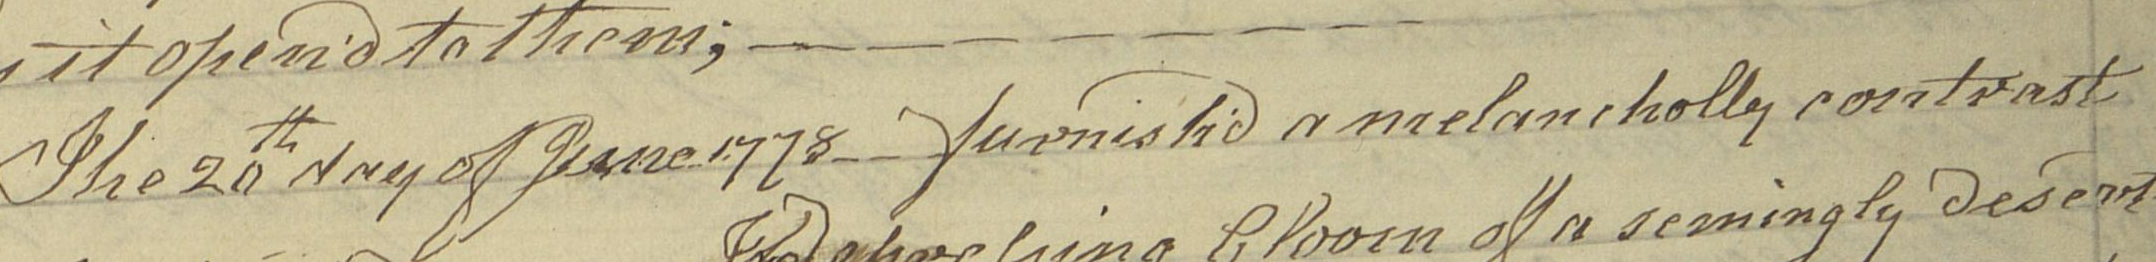The 20^th day of June 1778 furnished a melancholly contrast
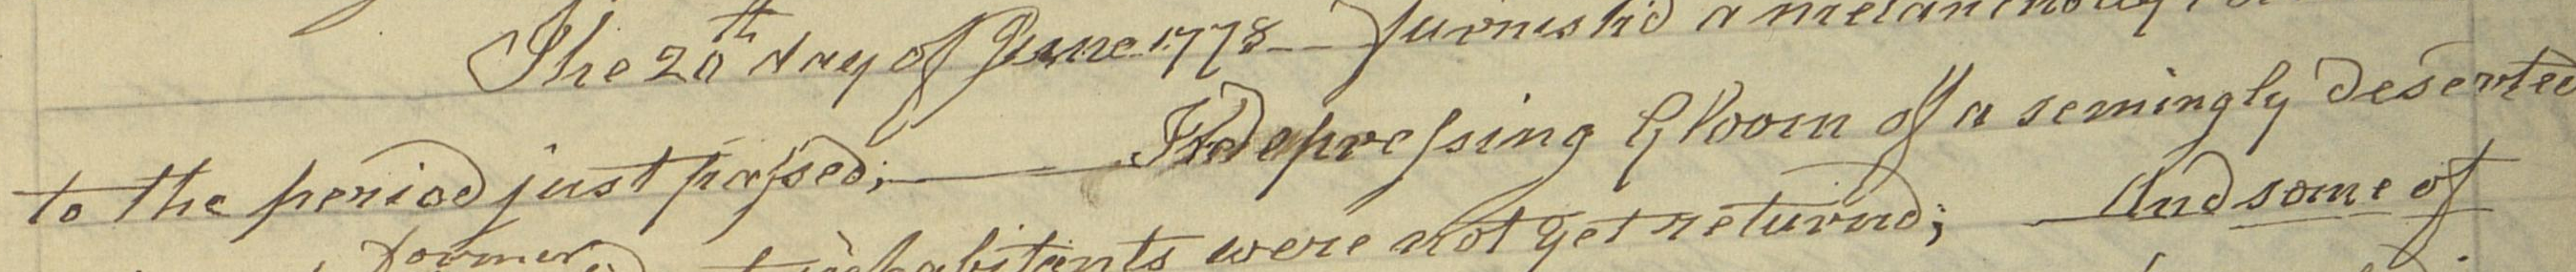to the period just passed; A depressing gloom of a seemingly deserted
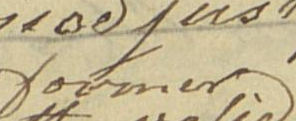former
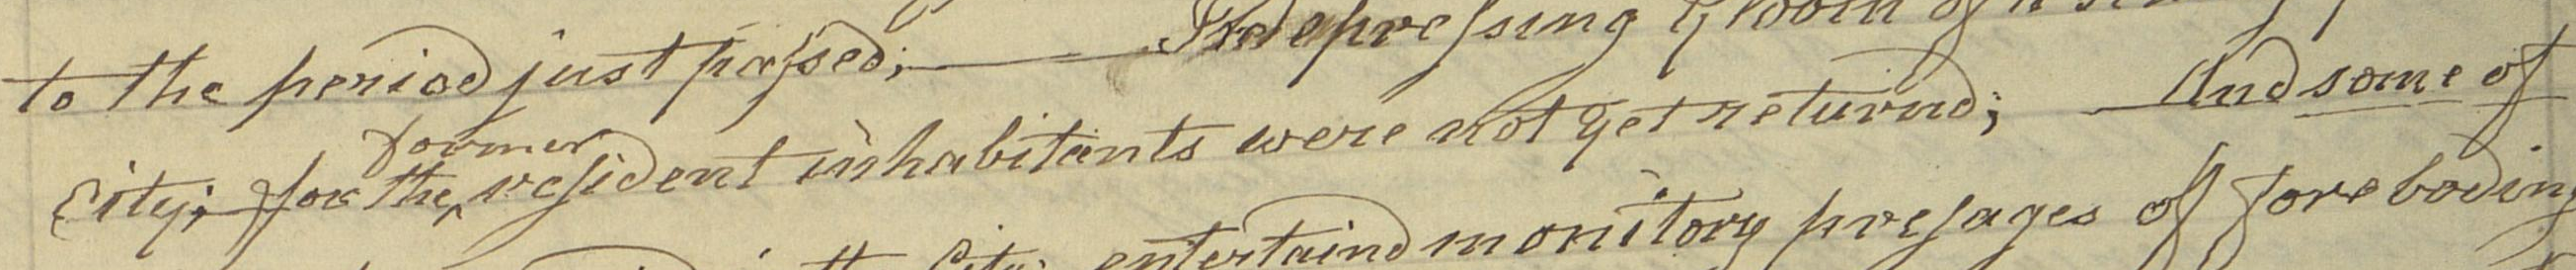City; for the ^ resident inhabitants were not yet returnd; And some of
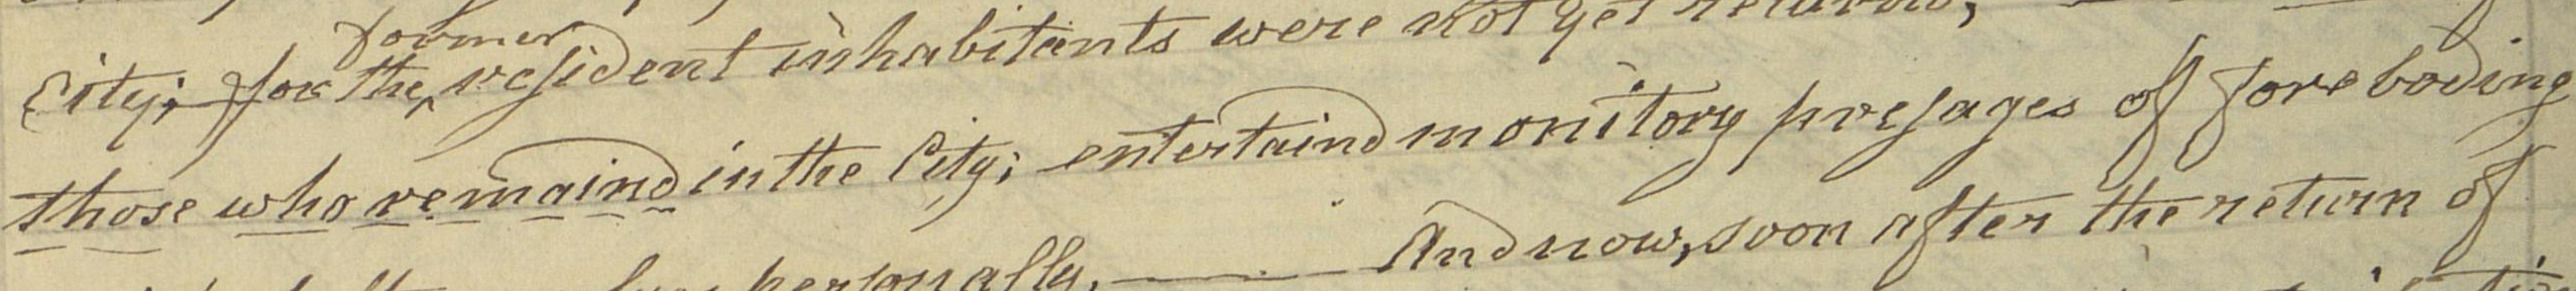those who remaind in the City; entertaind monitory presages of foreboding
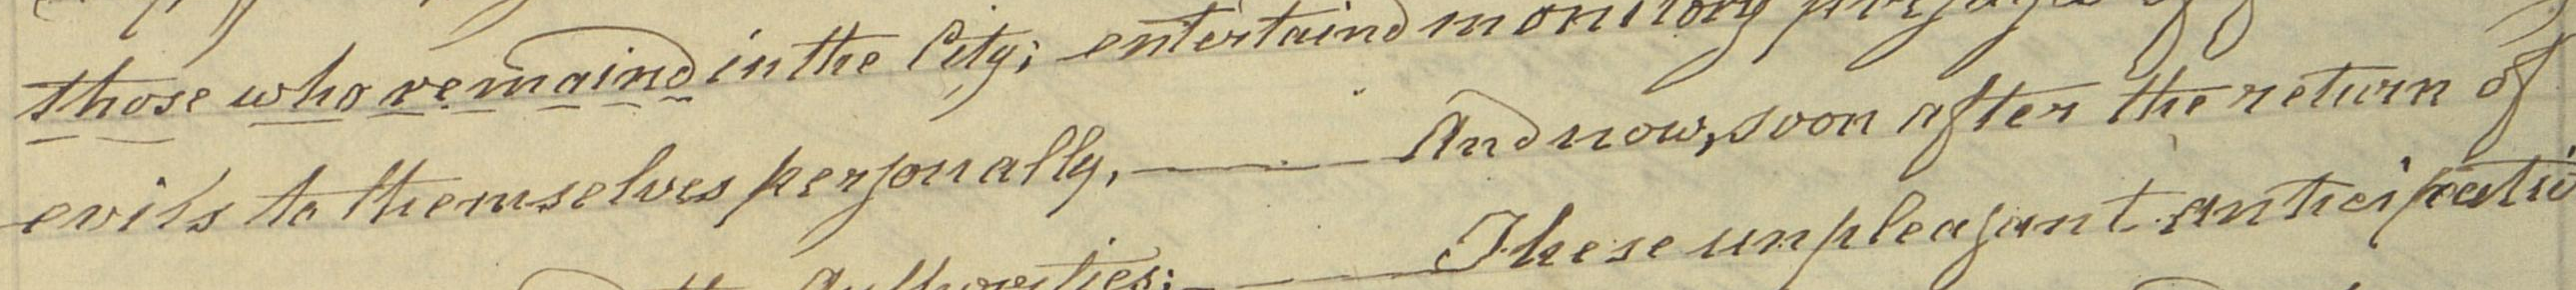evils to themselves personally. And now, soon after the return of
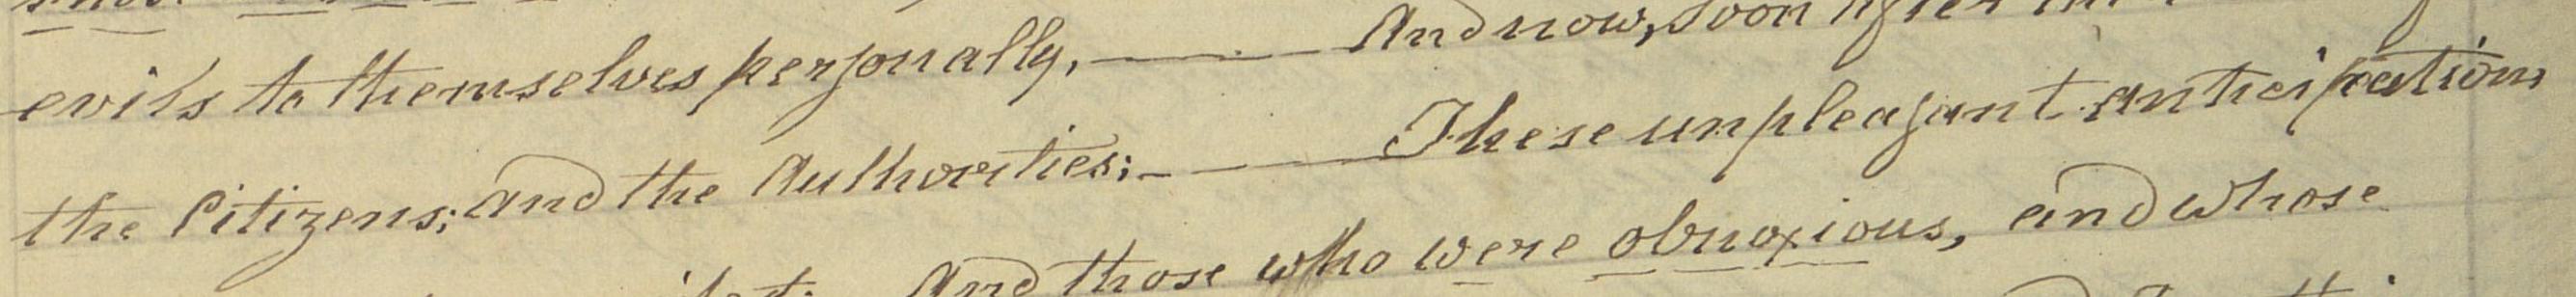the Citizens; and the Authorities; These unpleasant anticipation
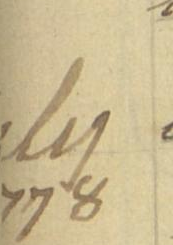-ly
